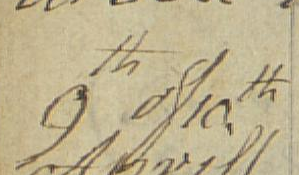9^th of 10^th
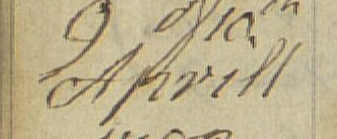Aprill
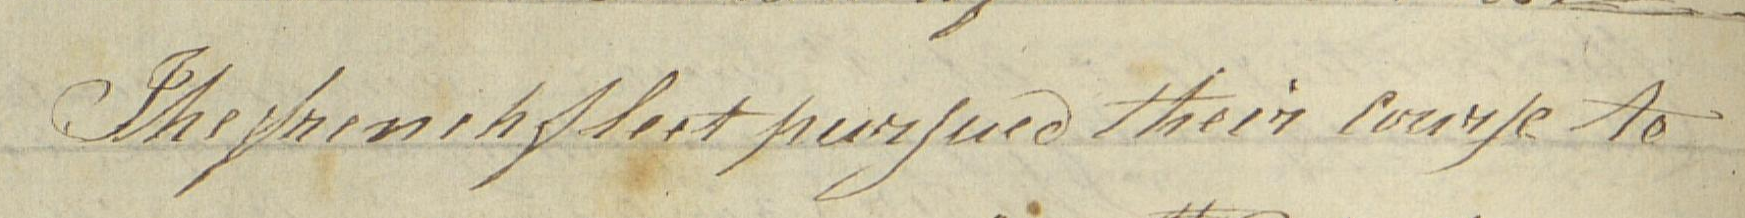The french fleet pursued their course to
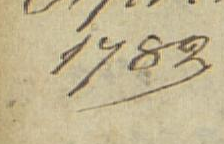1782
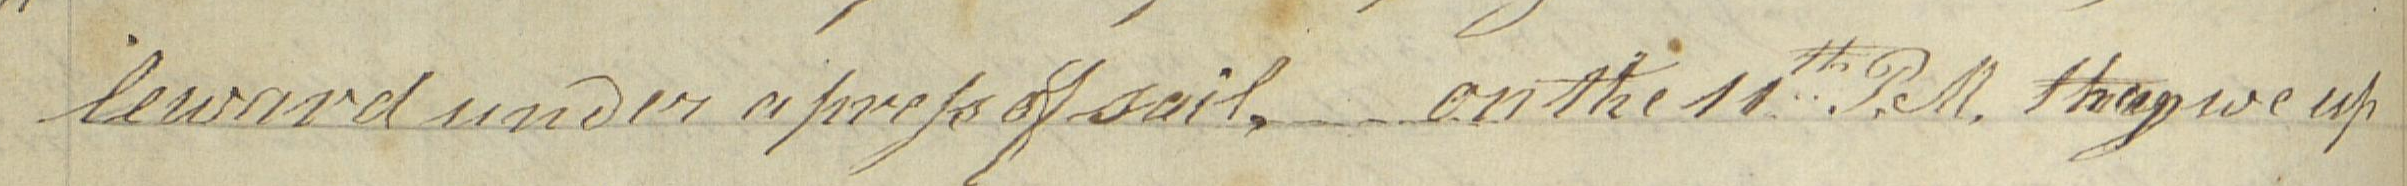leward under a press of sail, on the 11^th. P M. they we up
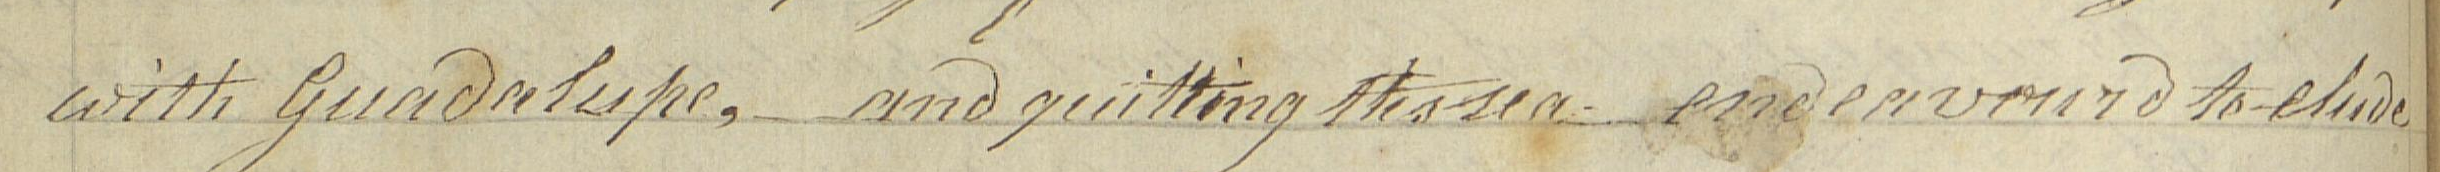with Guadalupe, and quitting the sea endeavourd to elude
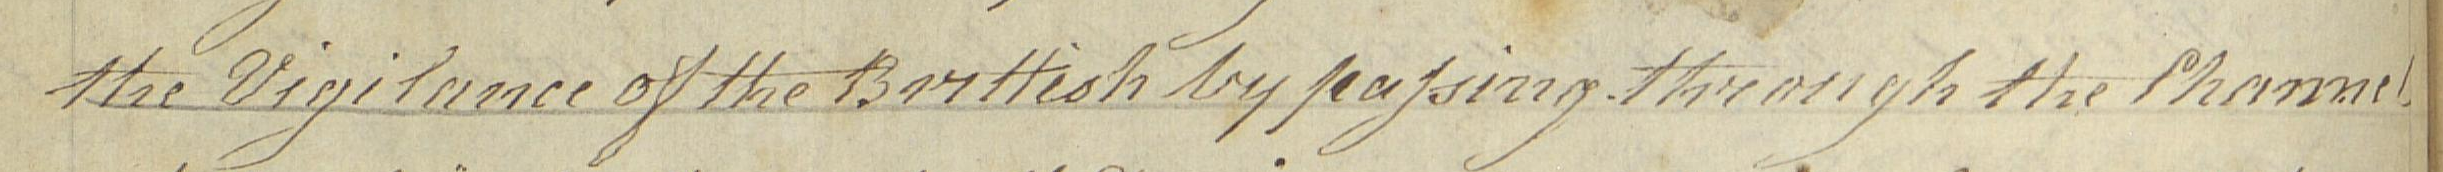the Vigilance of the Brittish by passing through the Channel
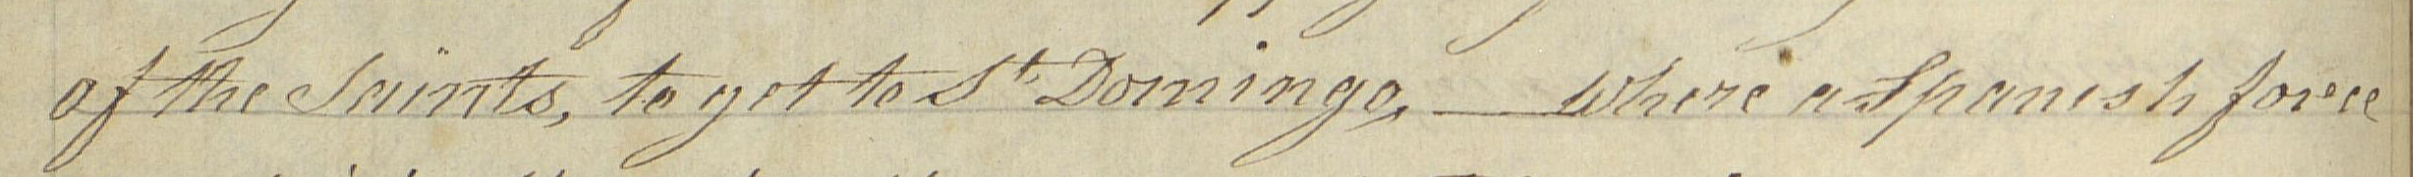of the Saints, to get to S^t Domingo, where a Spanish force
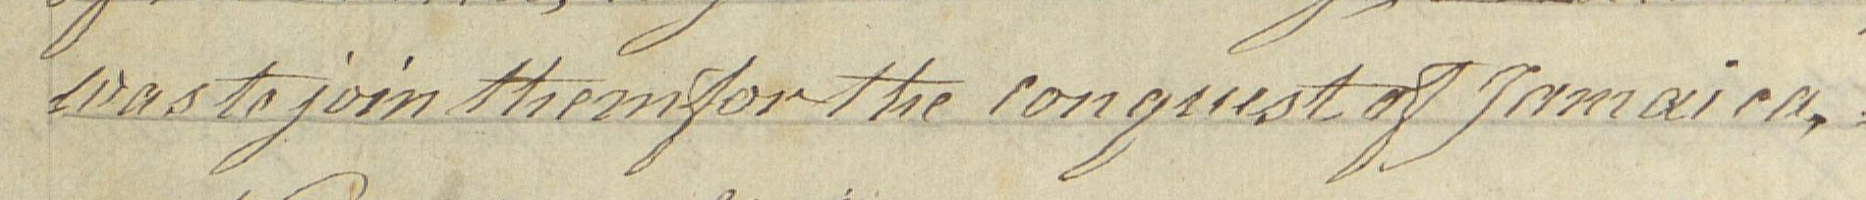was to join them for the conquest of Jamaica,
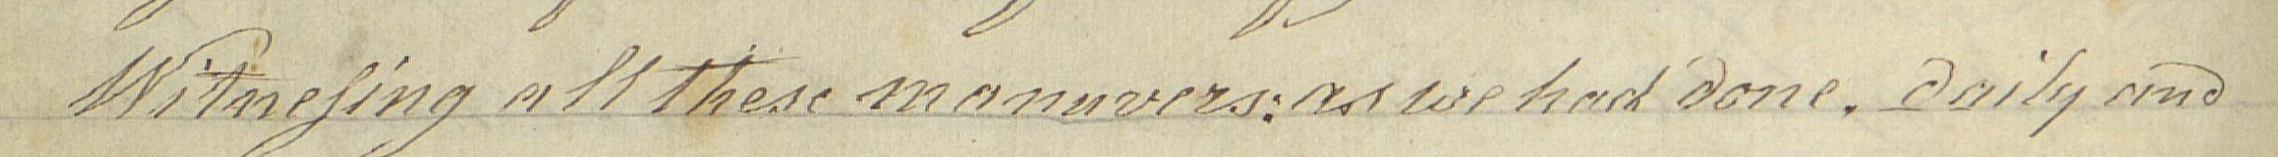Witnesing all these manuvers: as we had done, daily and
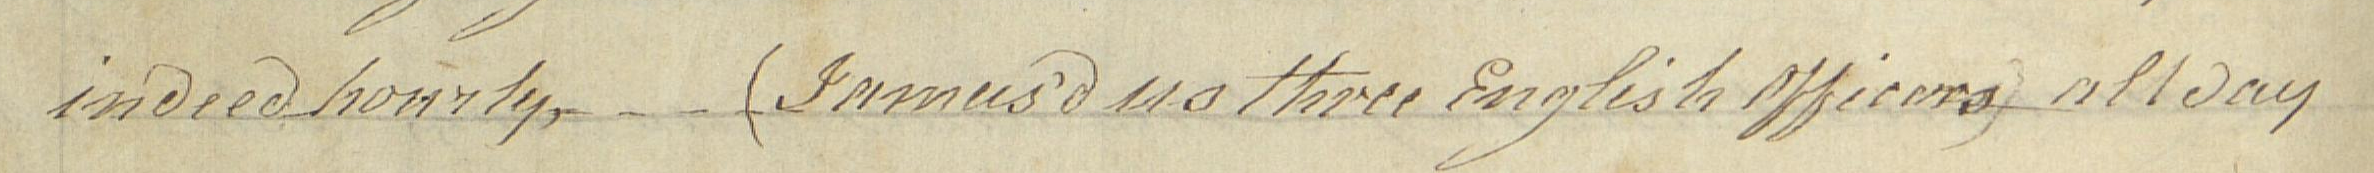indeed hourly, (I amus'd 10 three English officers) allday
